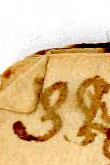32
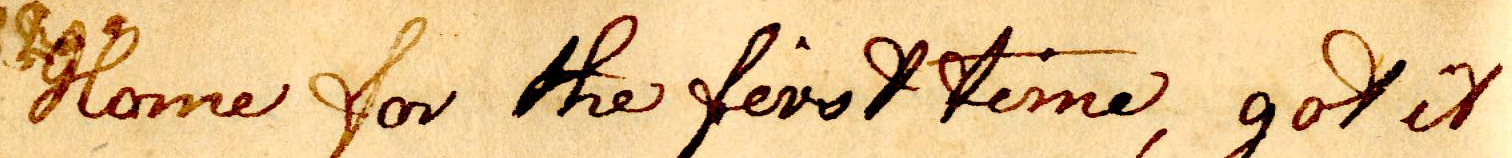Home for the first time, got it
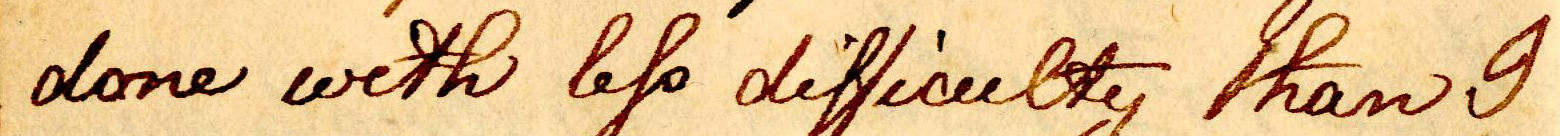done with less difficulty than I
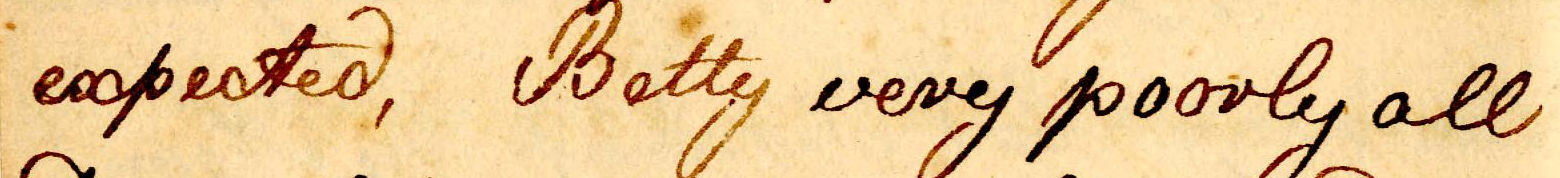expected, Betty very poorly all
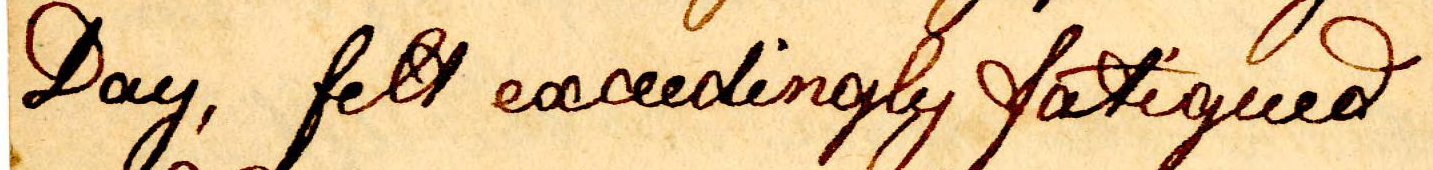Day, felt exceedingly fatigued
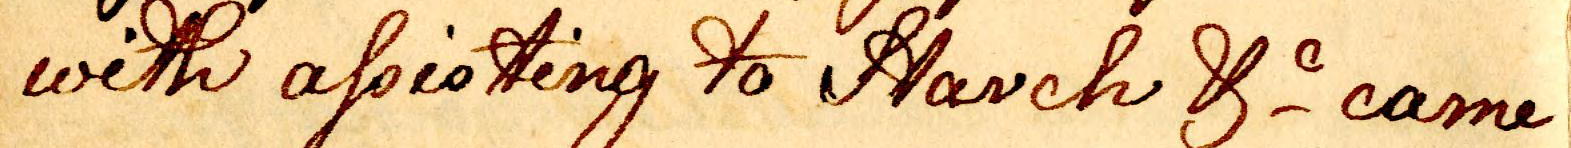with assisting to Starch &^c- came
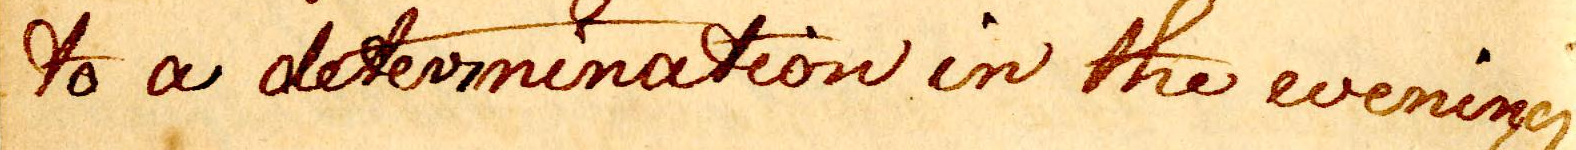to a determination in the evening
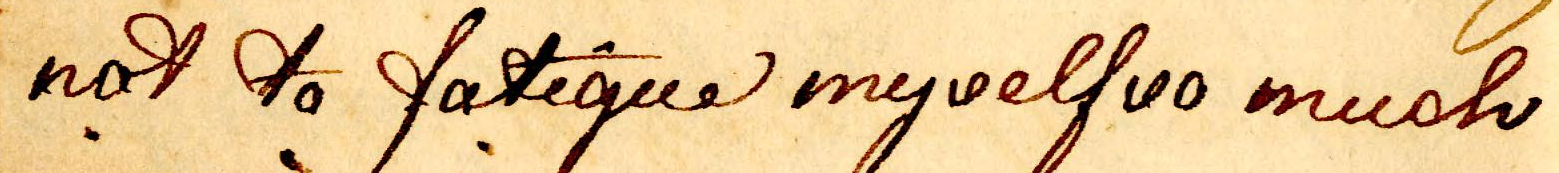not to fatigue myself so much
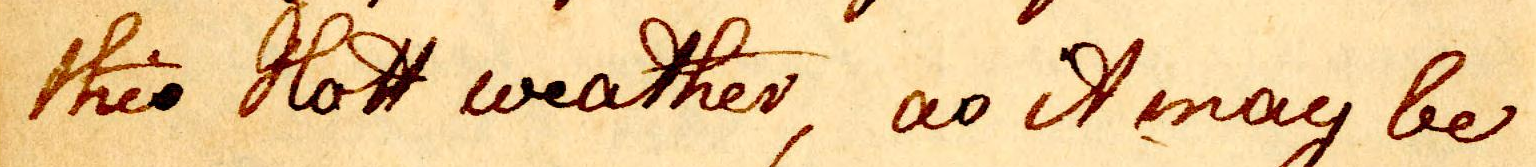this Hott weather, as it may be
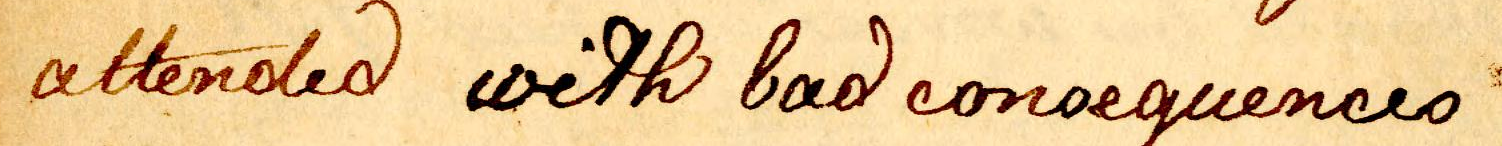attended with bad consequences
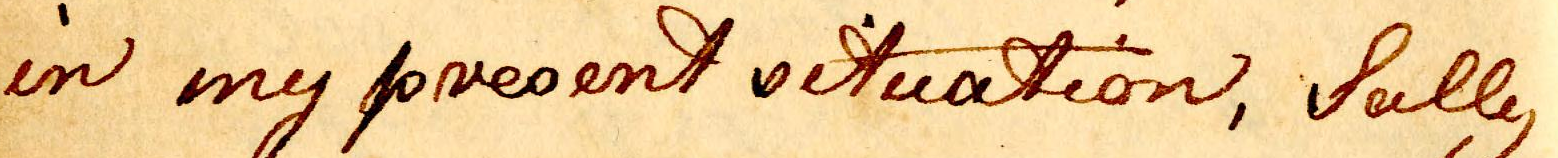in my present situation, Sally
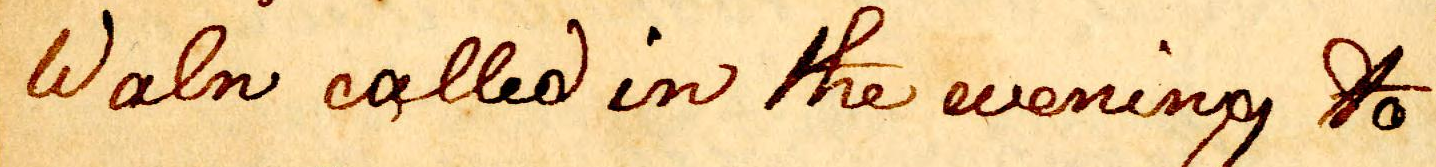Waln called in the evening to
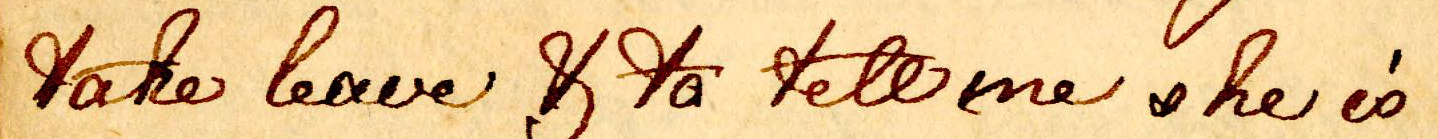take leave & to tell me she is
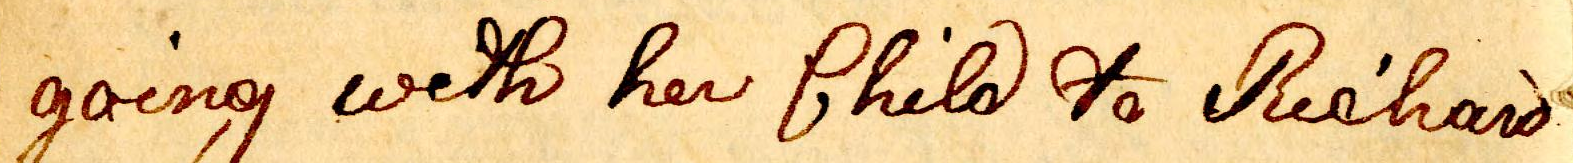going with her Child to Richard
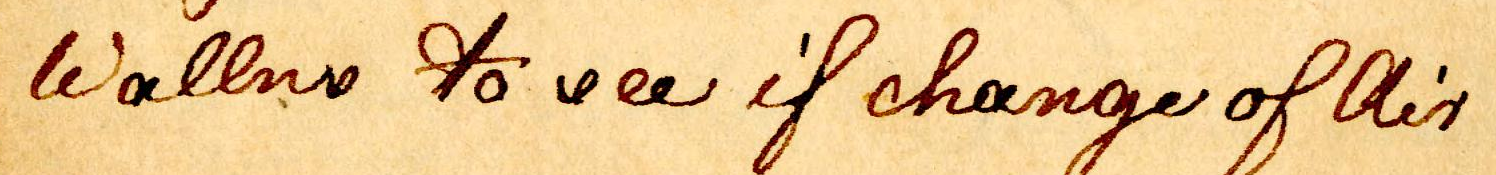Wallns to see if change of Air
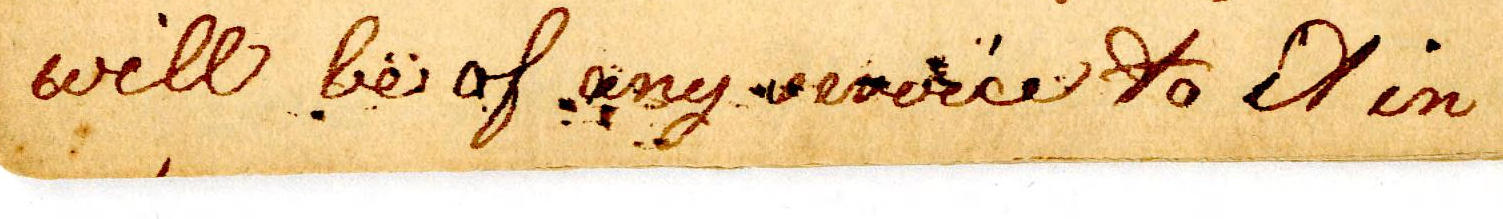will be of any service to it in
